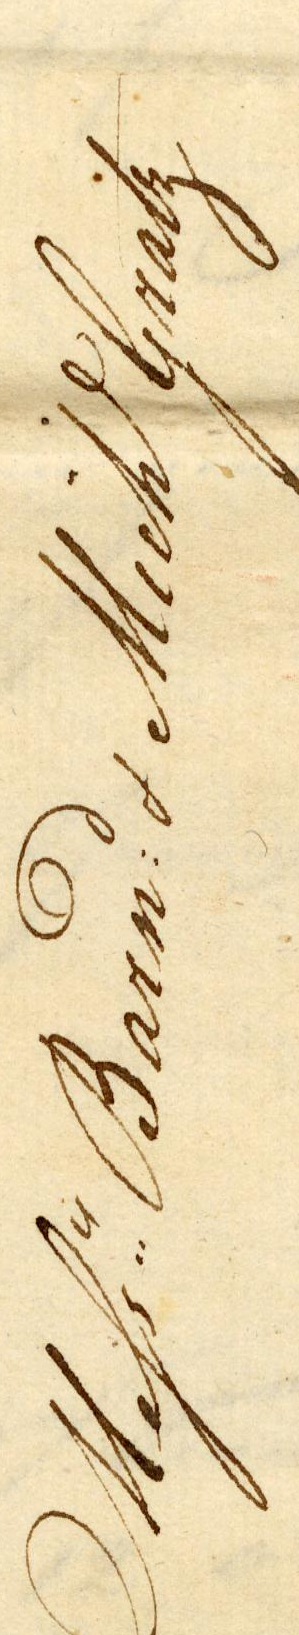Mess^rs Barn^d & Mich^l Gratz
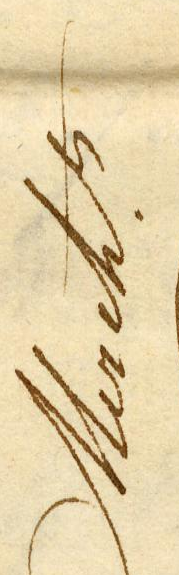Mrch^ts.
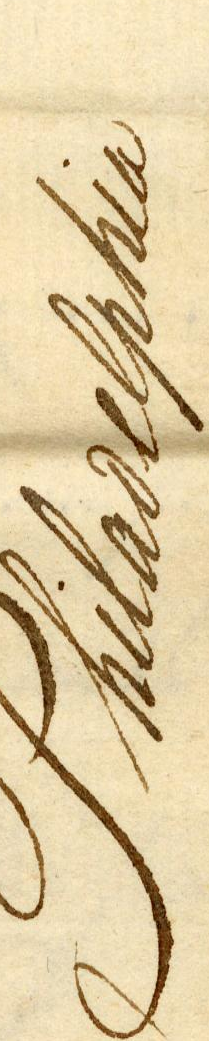Philadelphia
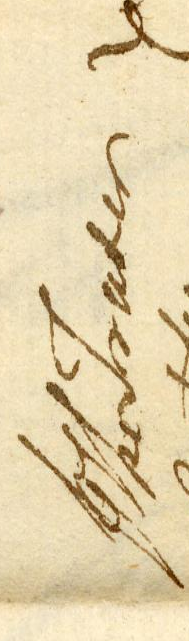per Trader
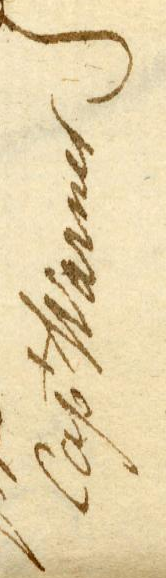Cap^t Warner
